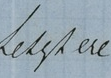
Berichten
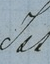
uns
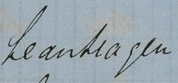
beantragen
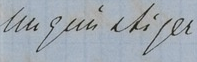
Auf diese Weise wird
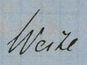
ein
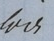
Fort-
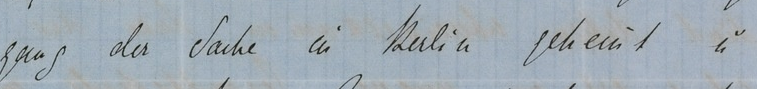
gang der Sache in Berlin gehemmt u wir
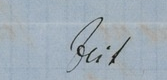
die
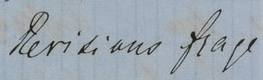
Revisionsfrage
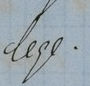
lege.
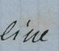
Sobald
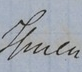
Berlin
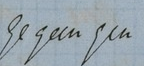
gegangen sein
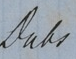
Ihnen
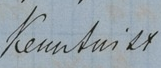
Kenntniss.
